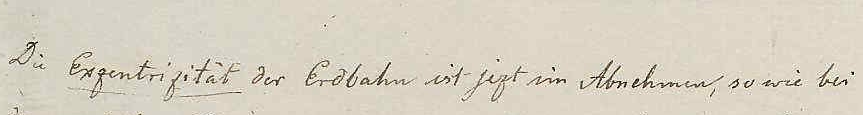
Die Exzentrizität der Erdbahn ist jezt im Abnehmen, so wie bei
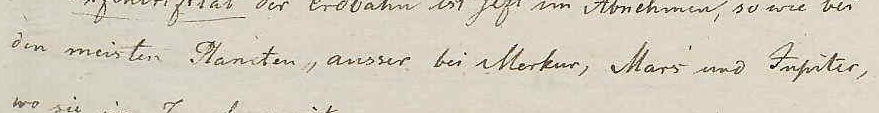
den meisten Planeten, ausser bei Merkur, Mars und Jupiter,
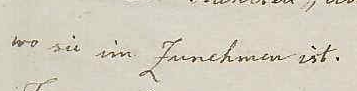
wo sie im Zunehmen ist.
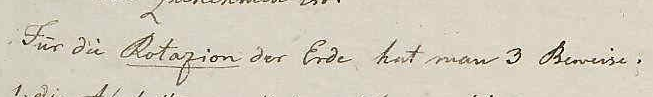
Für die Rotazion der Erde hat man 3 Beweise:
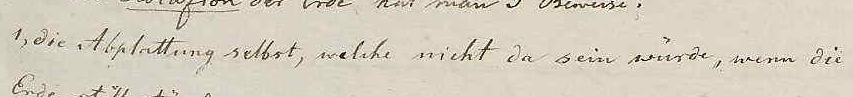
1, die Abplattung selbst, welche nicht da sein würde, wenn die
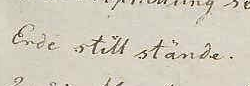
Erde still stände.
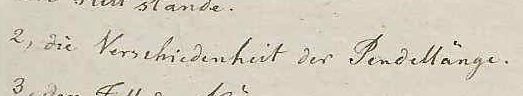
2, die Verschiedenheit der Pendellänge.
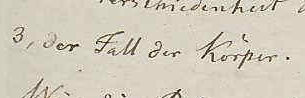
3, der Fall der Körper.
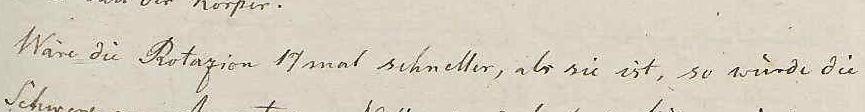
Wäre die Rotazion 17 mal schneller, als sie ist, so würde die
